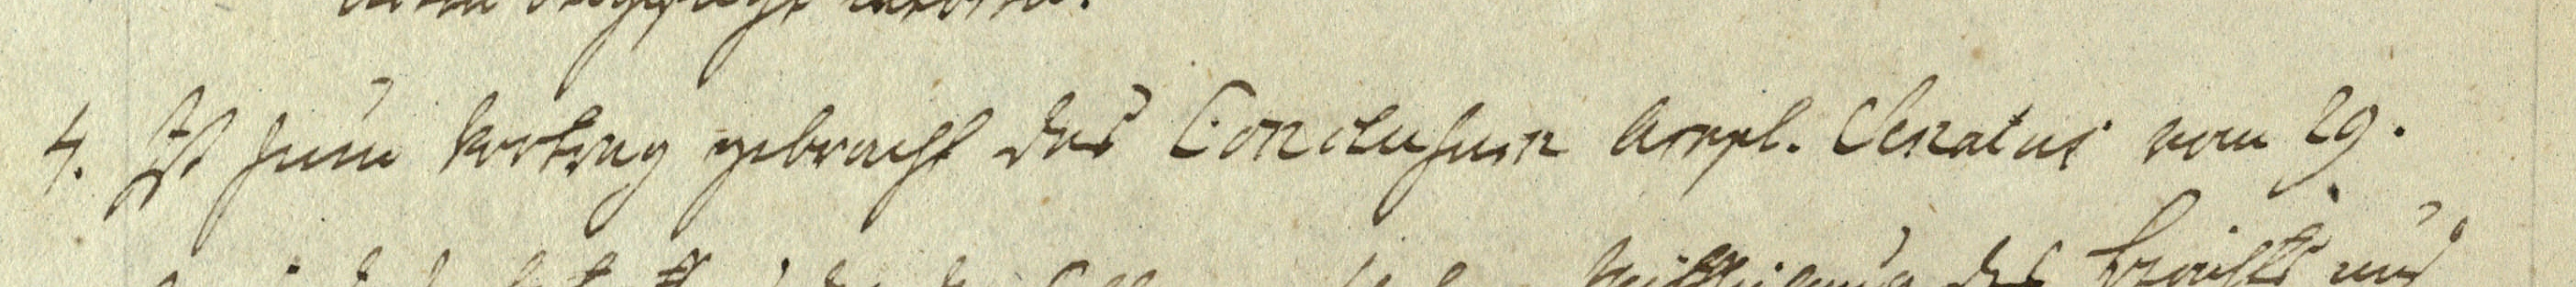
4. Ist zum Vortrag gebracht des Conclusum Ampl. Senatus vom 29.
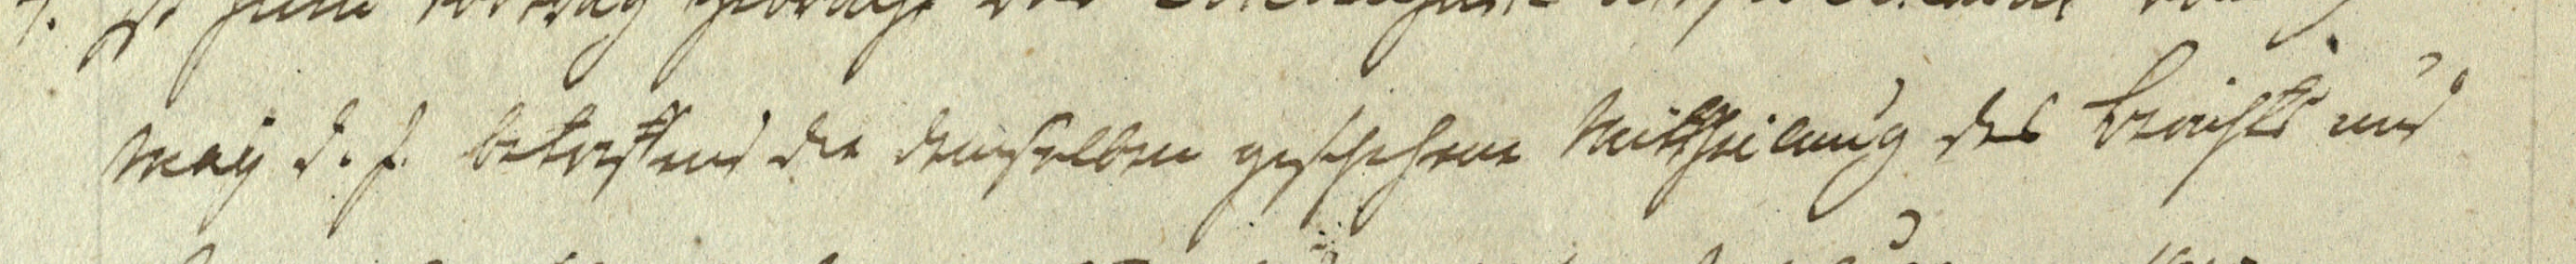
Maÿ d. J. betreffend die demselben geschehene Mittheilung des Berichts und
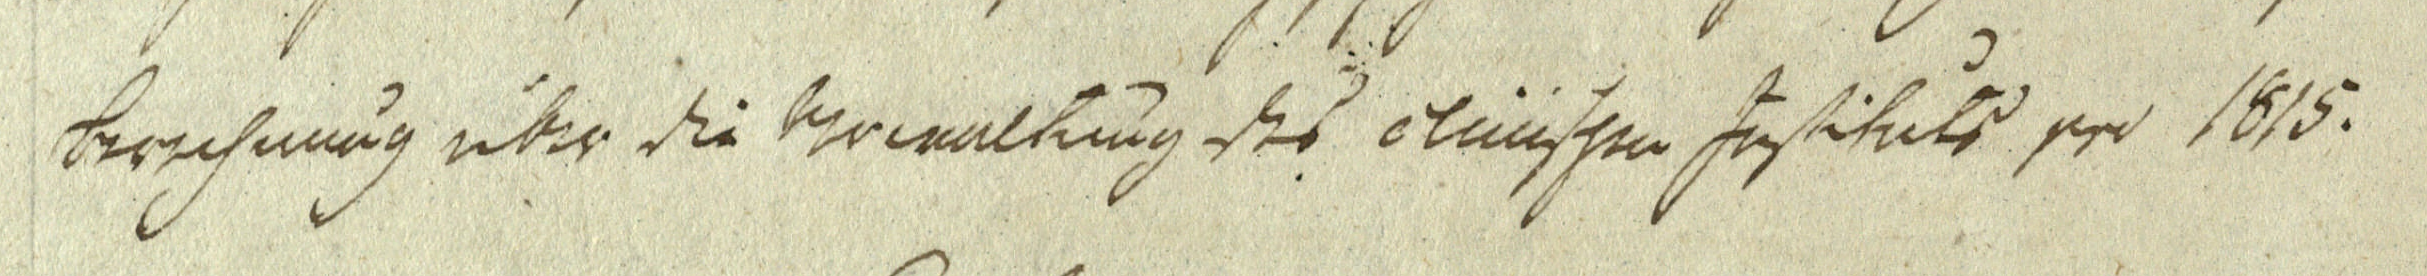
Berechnung über die Verwaltung des clinischen Instituts pro 1815.
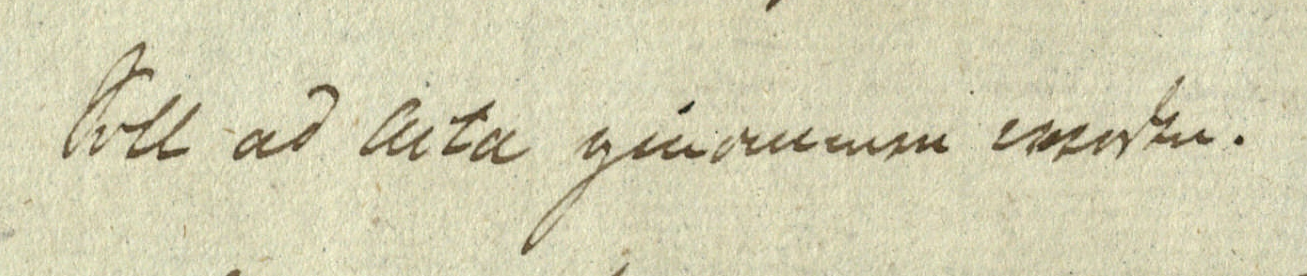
Soll ad Acta genommen werden.
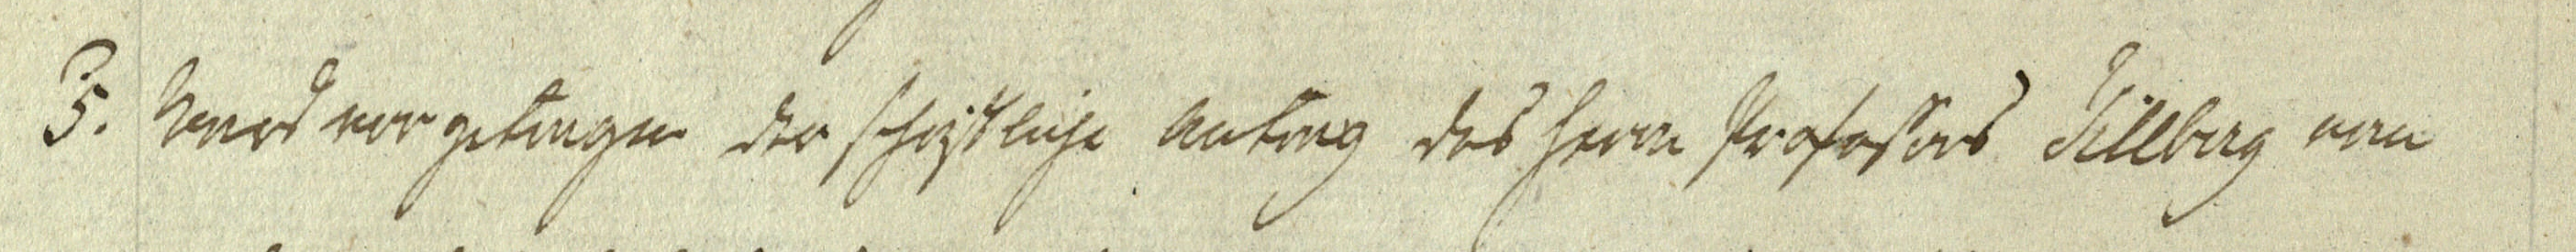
5. Ward vorgetragen der schriftliche Antrag des Herrn Professors Tillberg vom
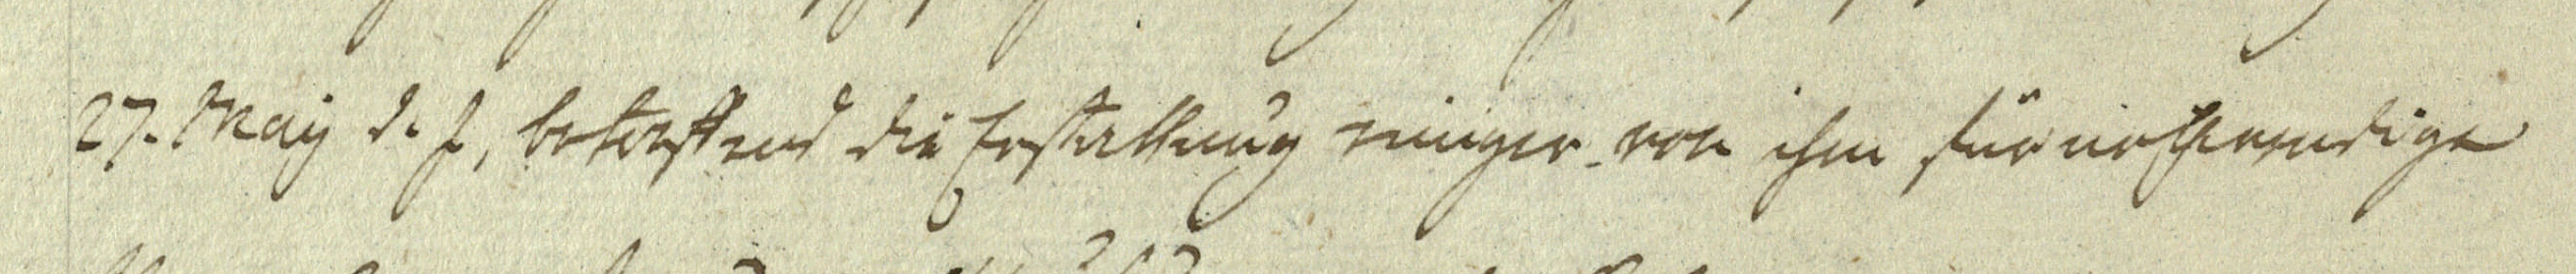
27. Maÿ d. J., betreffend die Erstattung einiger von ihm für nothwendige
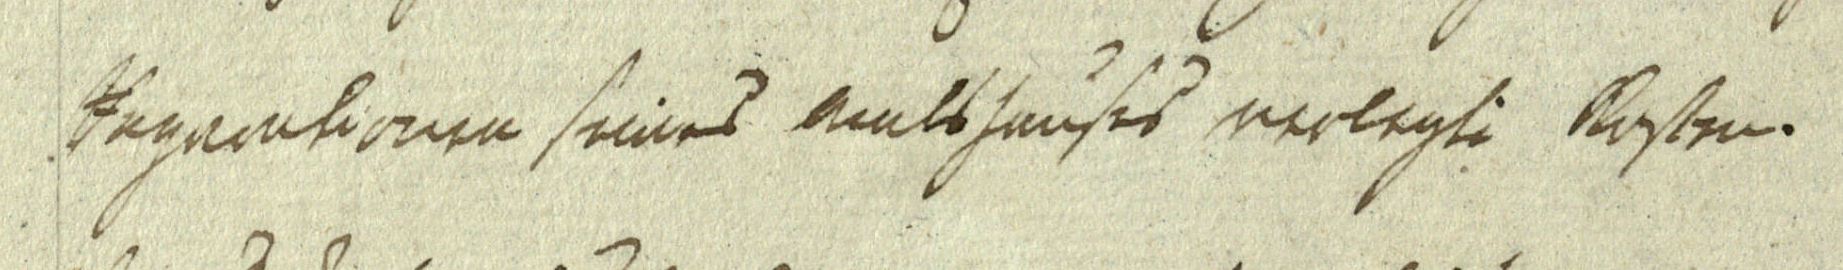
Reparationen seines Amtshauses verlegte Kosten.
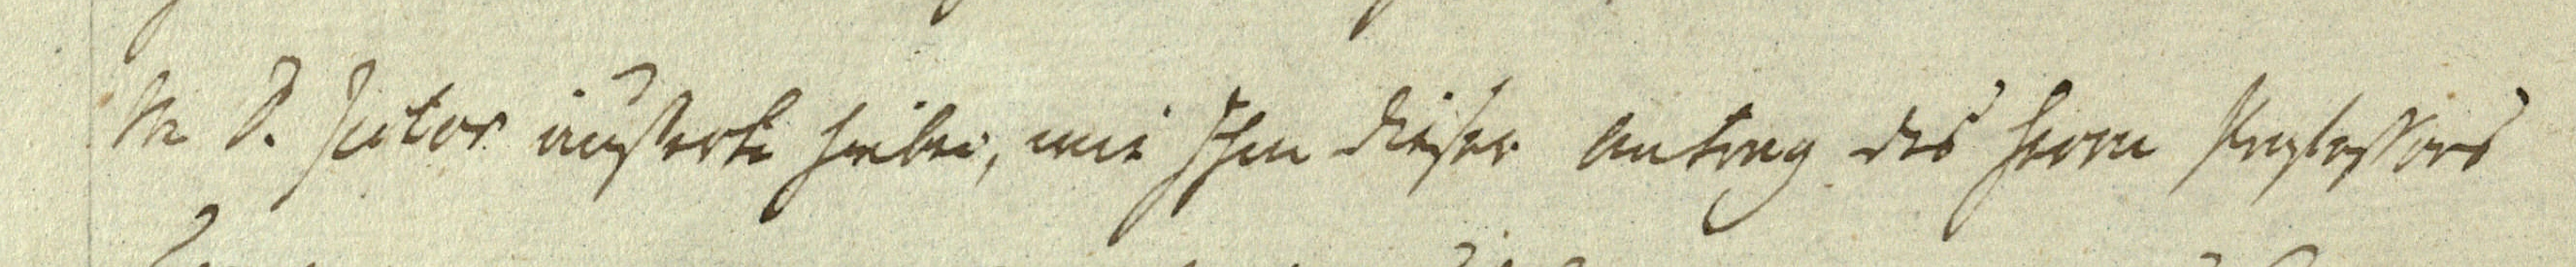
M. D. Rector äußerte hiebei, wie Ihm dieser Antrag des Herrn Professors
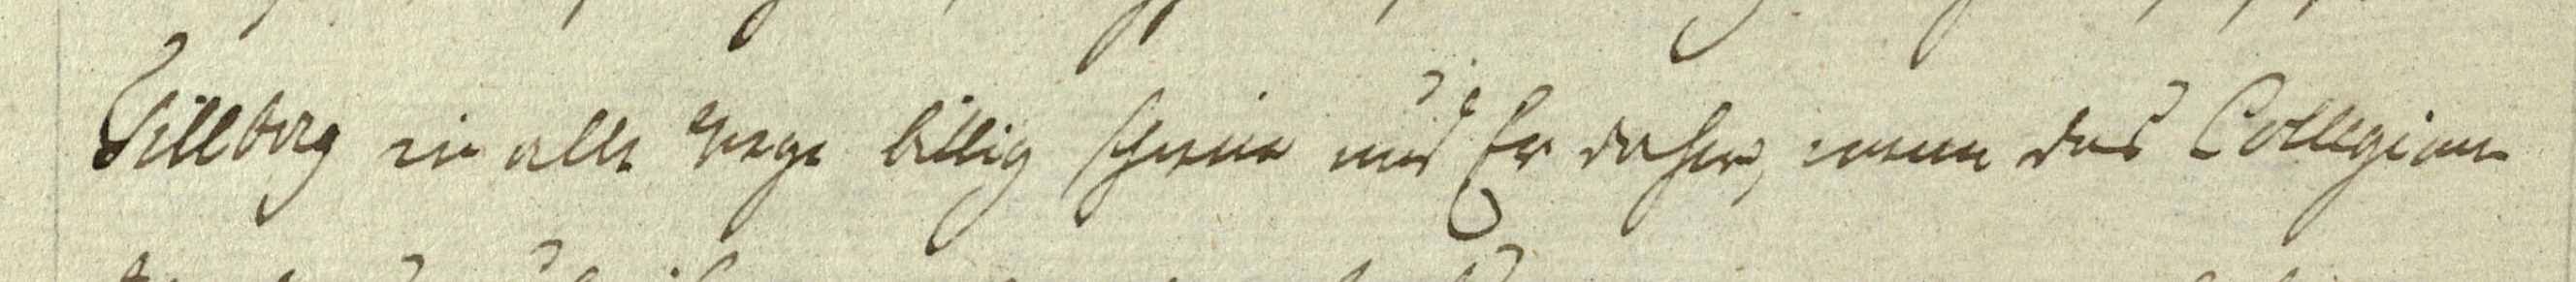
Tillberg in alle Wege billig scheine und Er daher, wenn das Collegium
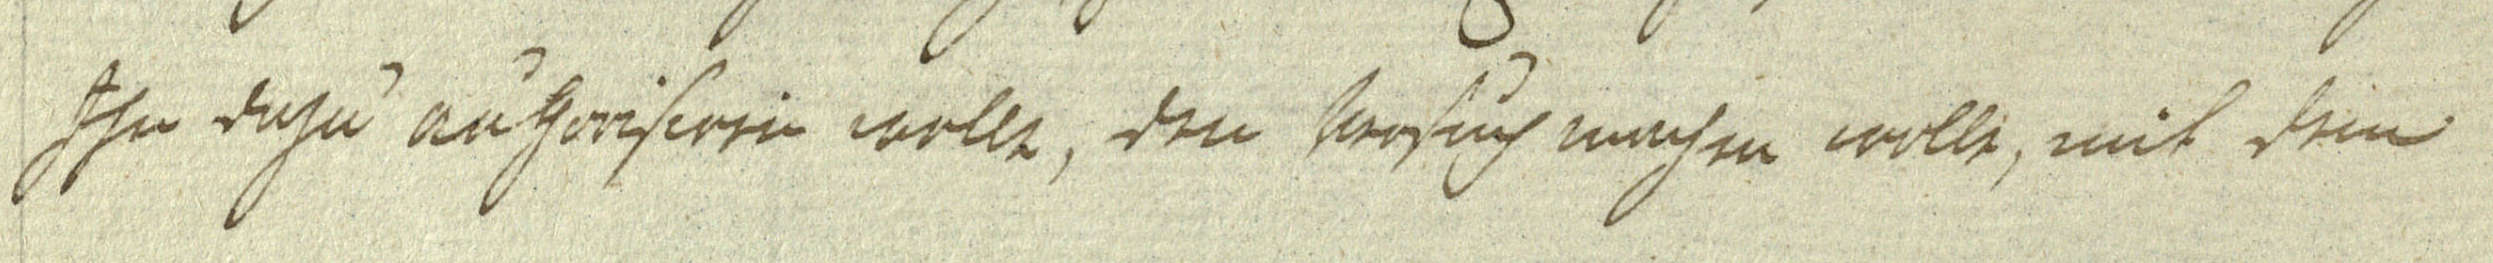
Ihm dazu authorisiren wolle, den Versuch machen wolle, mit dem
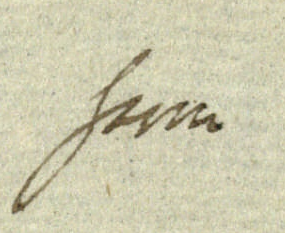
Herrn
